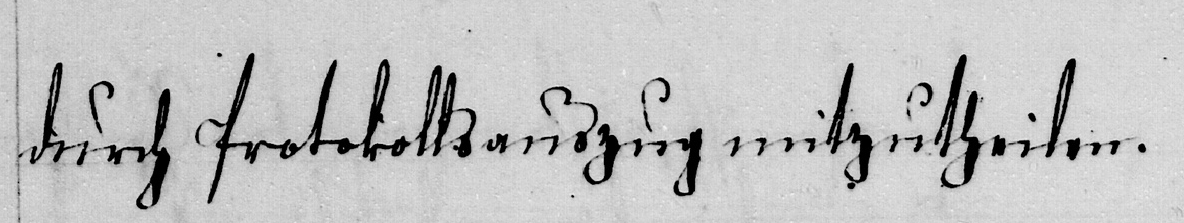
durch Protokollsauszug mitzutheilen.
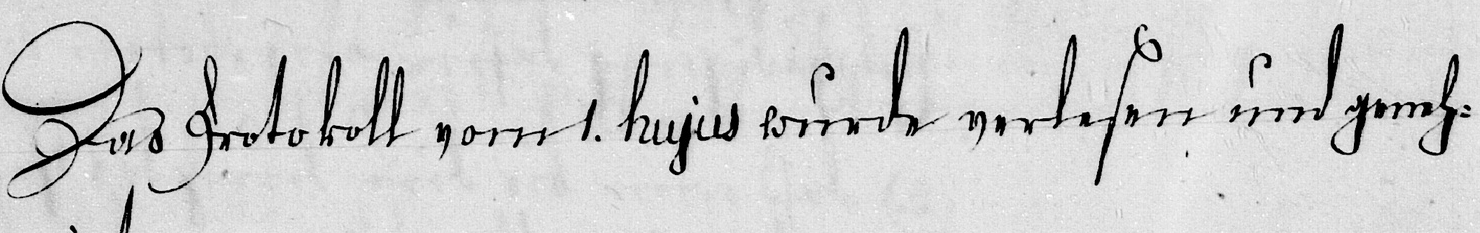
Das Protokoll vom 1. hujus wurde verlesen und geneh¬
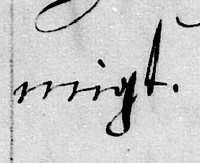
migt.
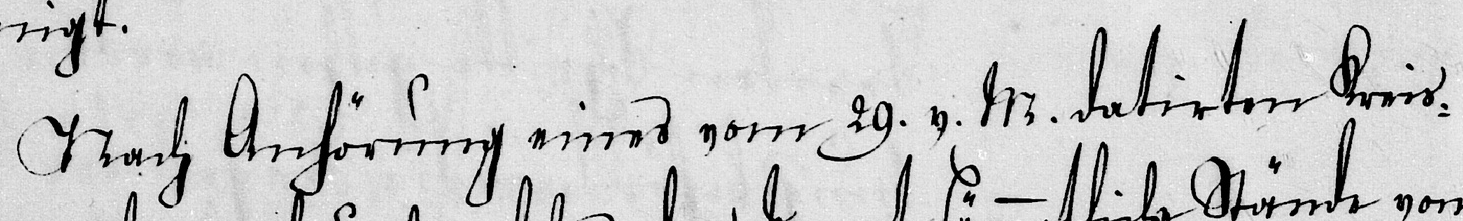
Nach Anhörung eines vom 29. v. M. datirten Kreis¬
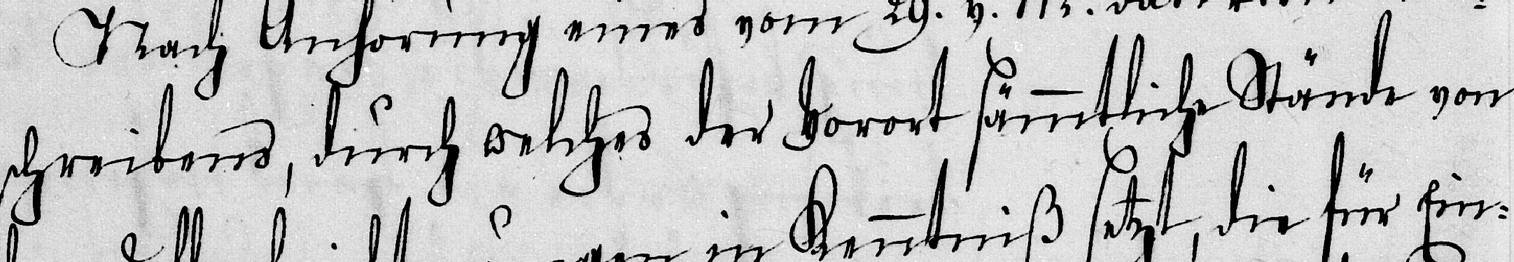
schreibens, durch welches der Vorort sämmtliche Stände von
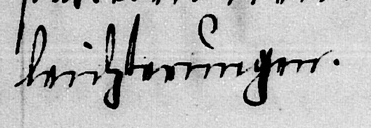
leichterungen
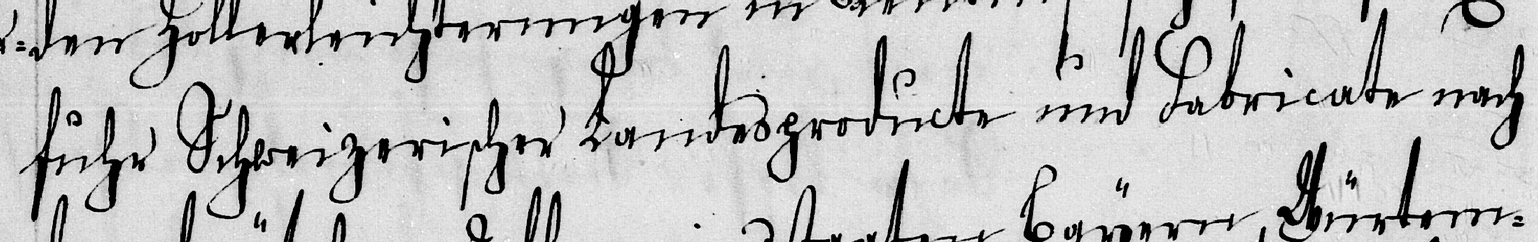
fuhr Schweizerischer Landesproducte und Fabricate nach
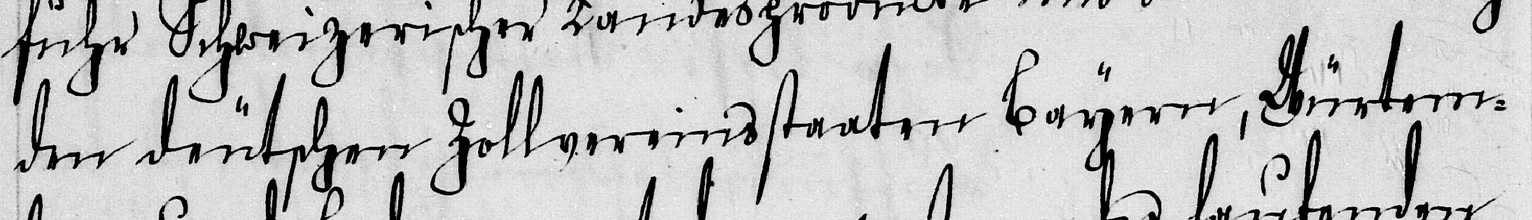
den deutschen Zollvereinsstaaten Bayern, Würtem¬
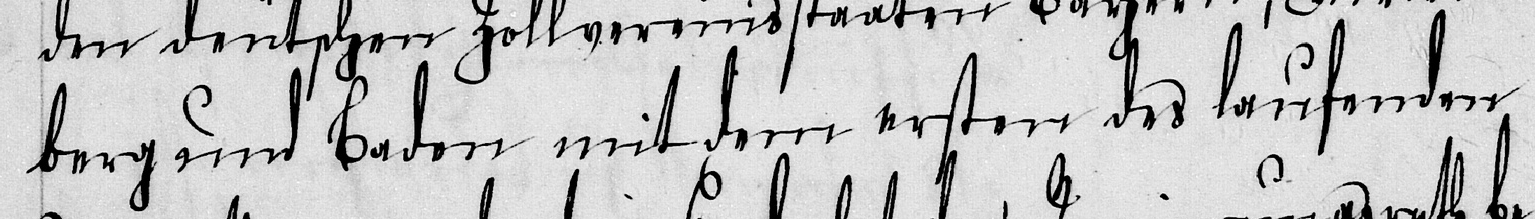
berg und Baden mit dem ersten des laufenden
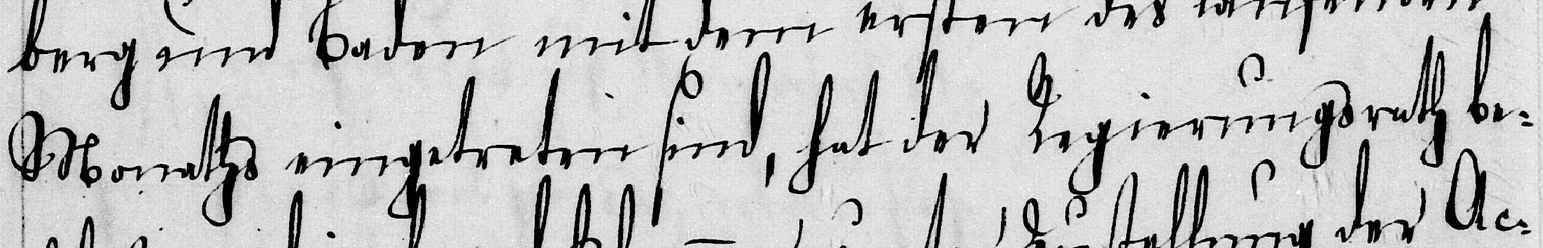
Monaths eingetreten sind, hat der Regierungsrath be¬
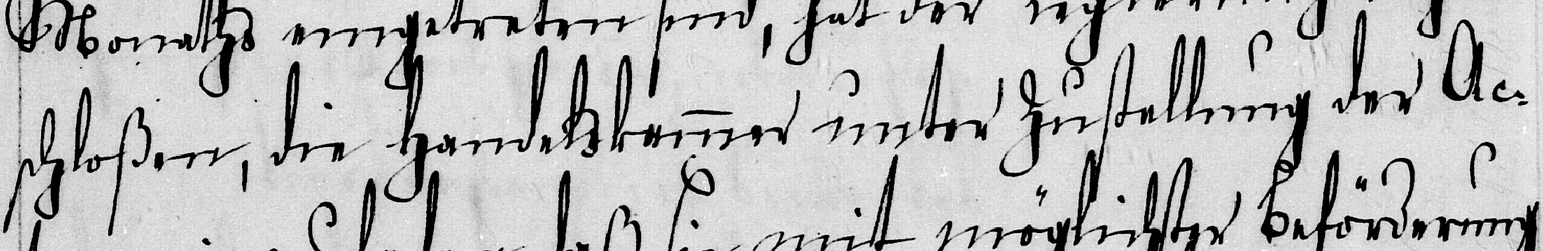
schloßen, die Handelskammer unter Zustellung der Ac¬
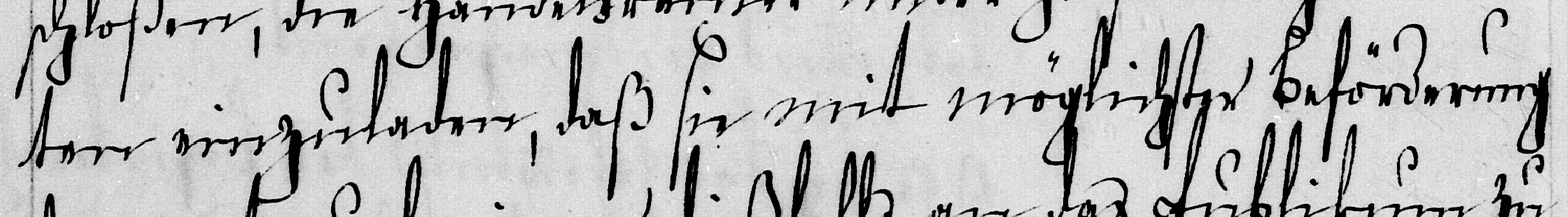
ten einzuladen, daß sie mit möglichster Beförderung
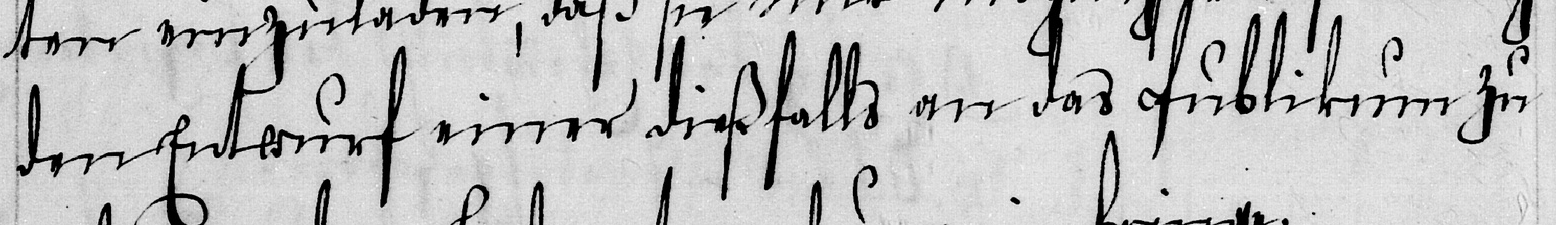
den Entwurf einer dießfalls an das Publikum zu
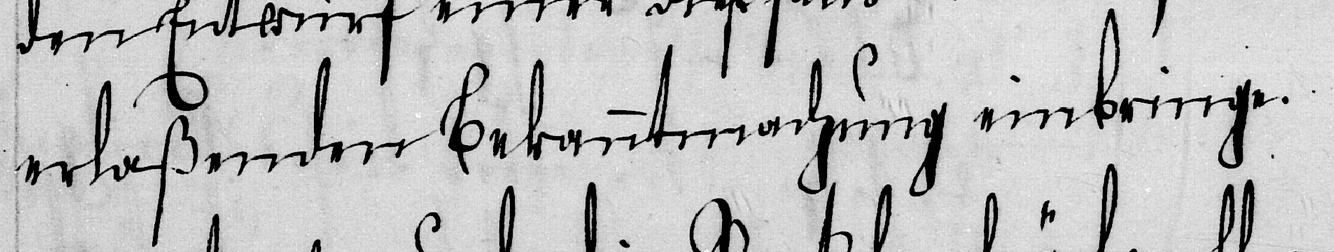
erlaßenden Bekanntmachung einbringe.
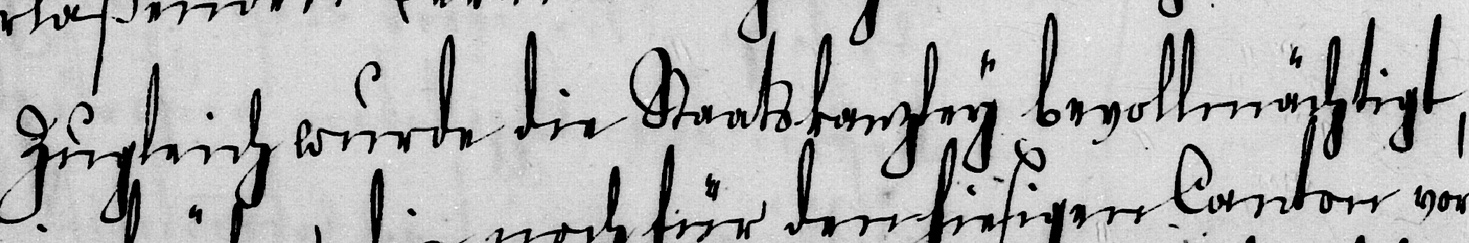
Zugleich wurde die Staatskanzley bevollmächtigt,
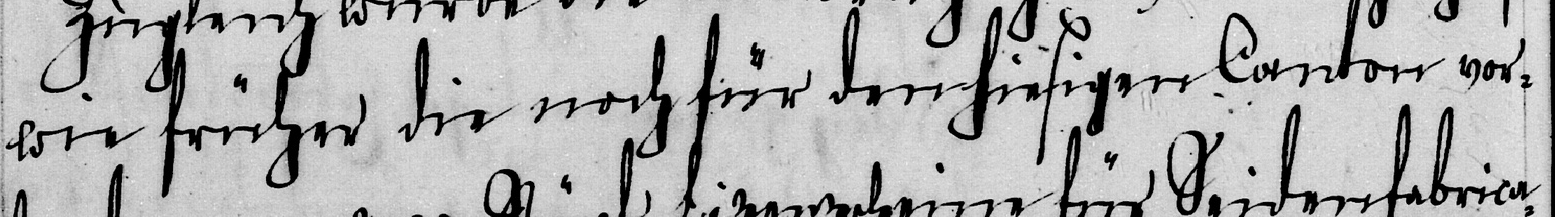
wie früher die noch für den hiesigen Canton vor¬
